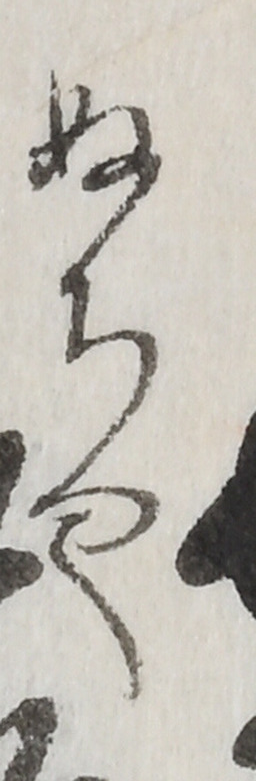ぬちや
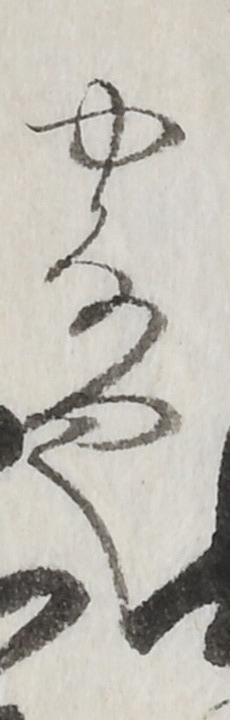やなや

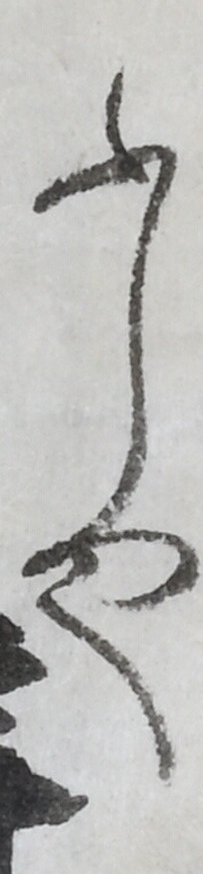ふしや
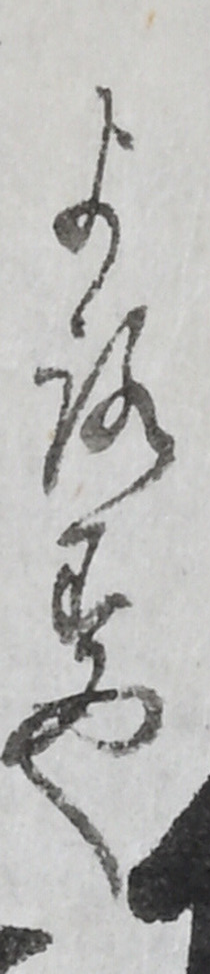よろすや
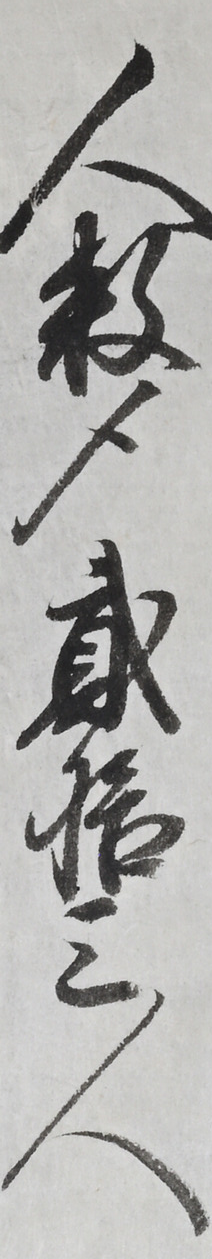人数〆弐拾三人
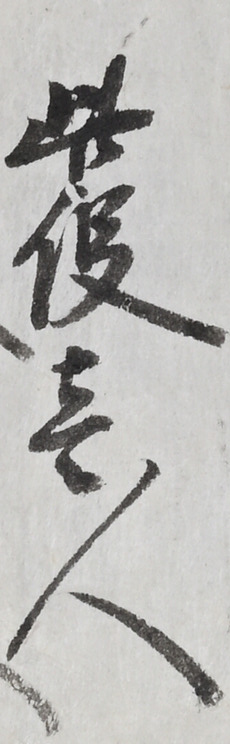此役壱人
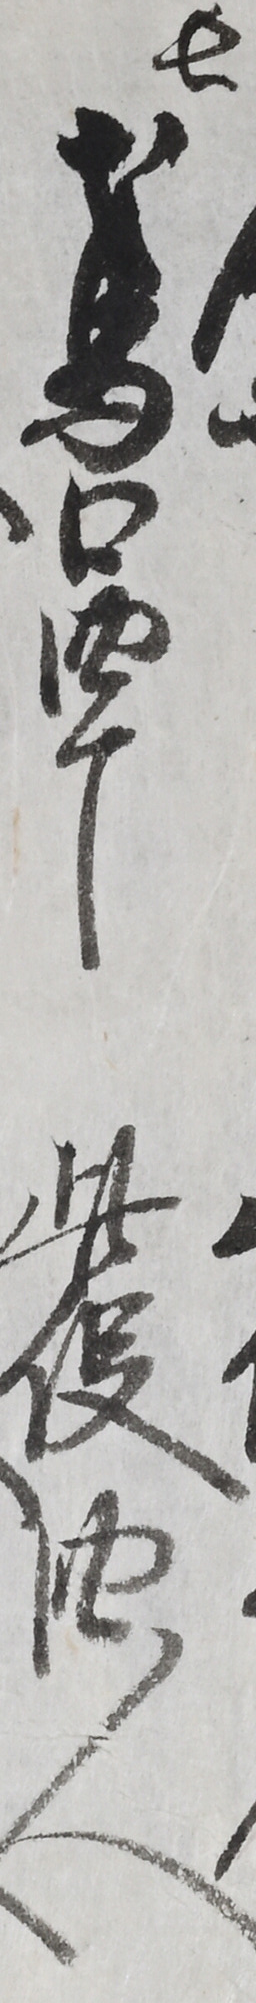長鳶口四丁此役四人
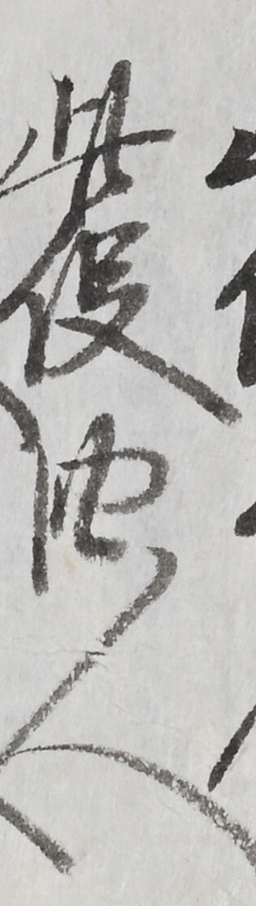此役壱人
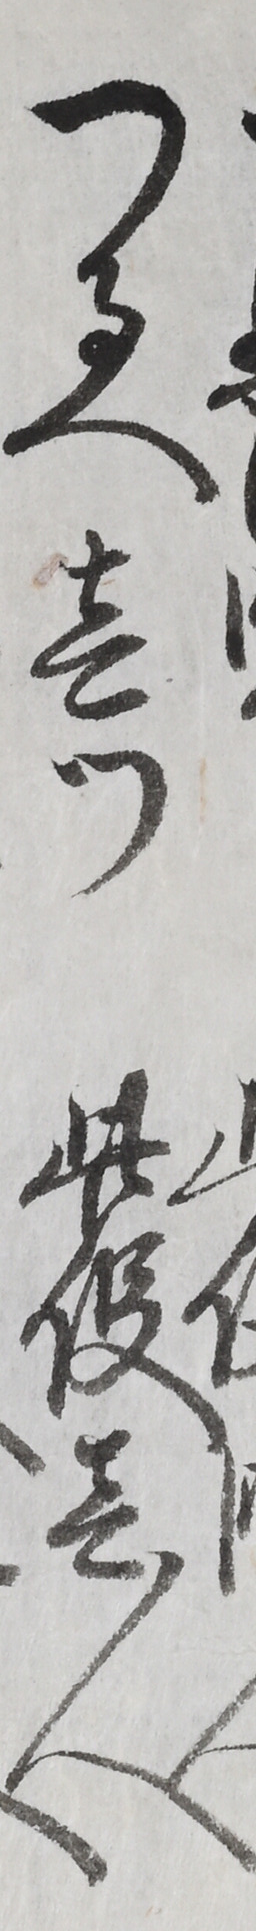つるへ壱つ此役壱人
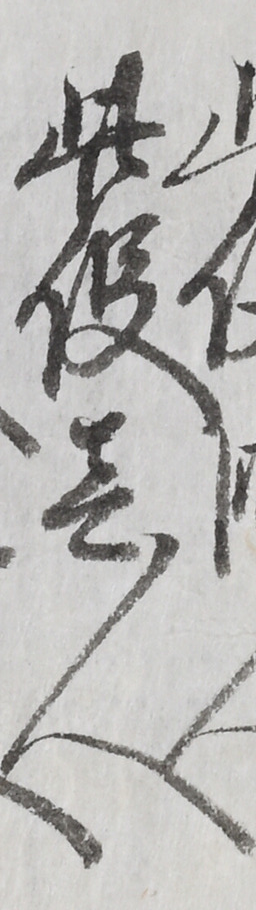此役壱人
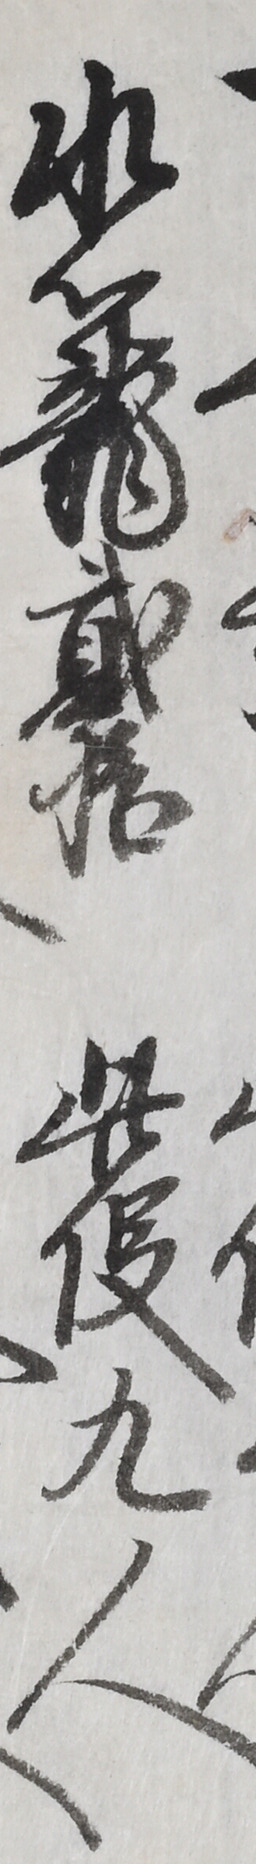水籠弐拾此役九人
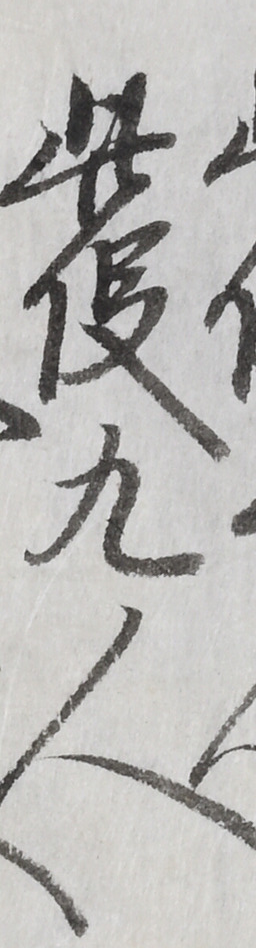此役壱人
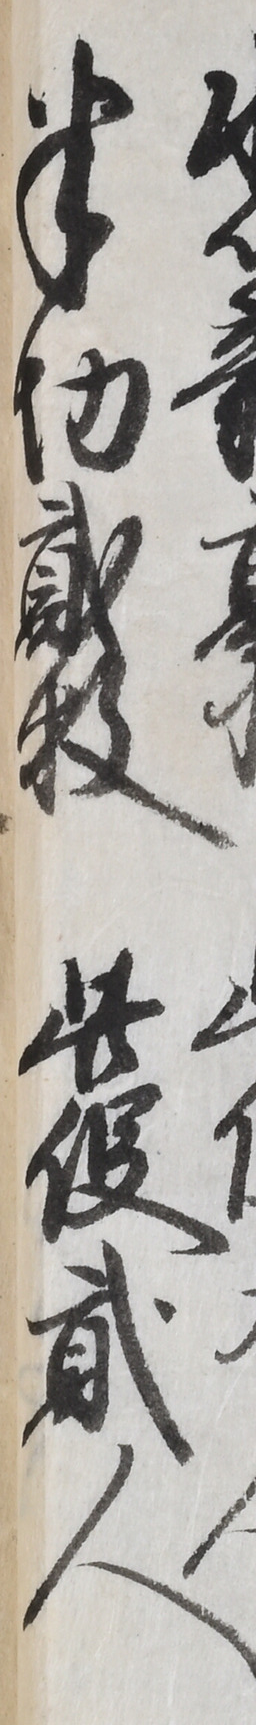半切弐枚此役弐人
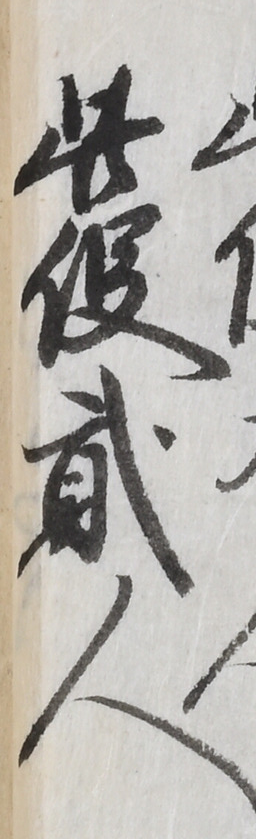此役壱人
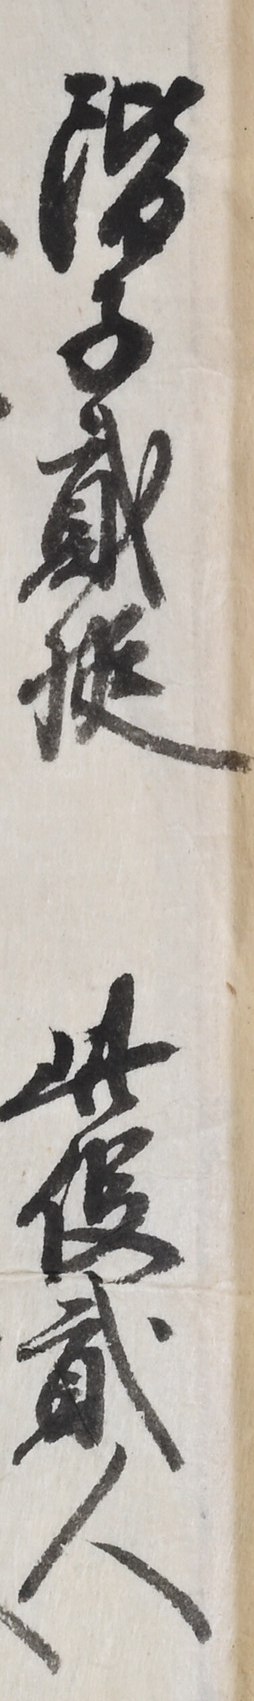階子弐挺此役弐人
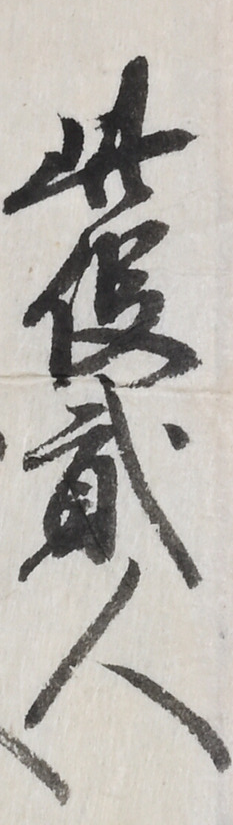此役壱人
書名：當町火消道具幷役付帳
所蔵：伊那市立高遠町図書館・合同会社AMANE
